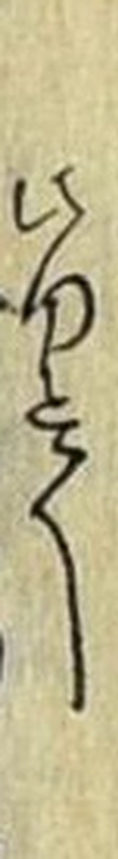此内壱人
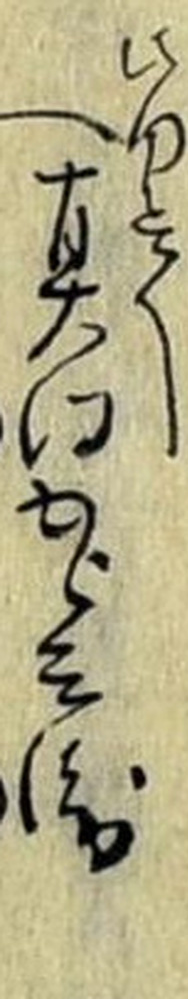真田五郎兵衛
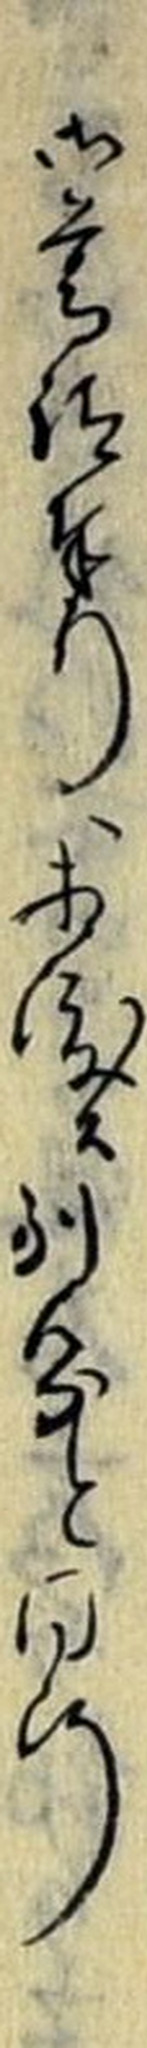御普請奉行へ相渡す別紙と同断
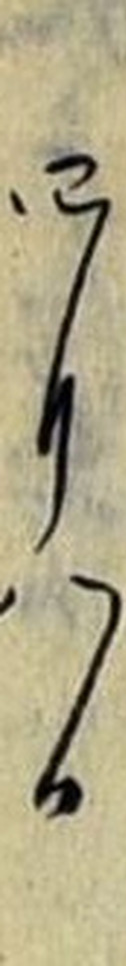四月八日
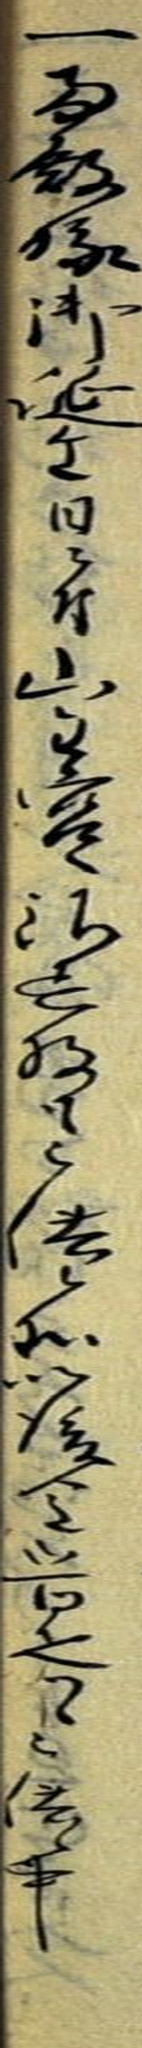一両殿様御誕生日に付山王宮へ銀壱枚つヽ被供候処以後金弐百疋つヽ被供候事
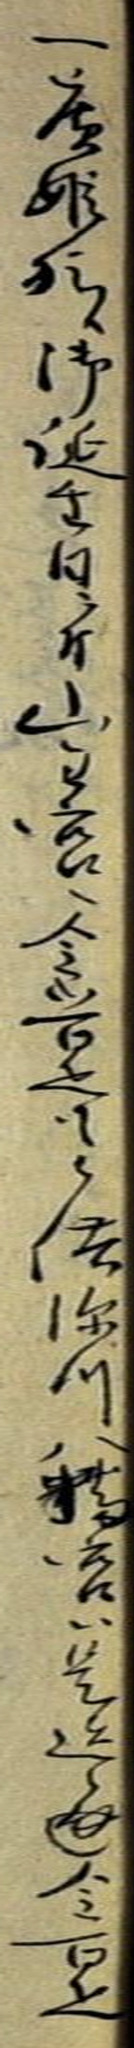一広姫様御誕生日に付山王宮へ金弐百疋つヽ被供深川八幡宮は是迄之通金百疋
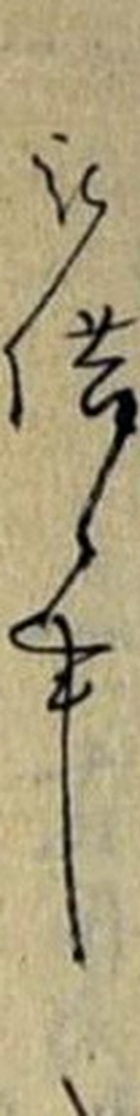被供候事
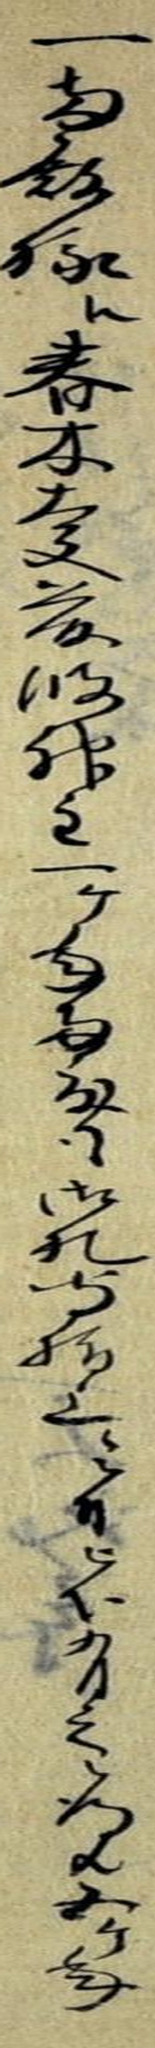一両殿様江春木太夫藤波神主一ヶ年両度つヽ御札守指上候に付被下有之候得供五ヶ年
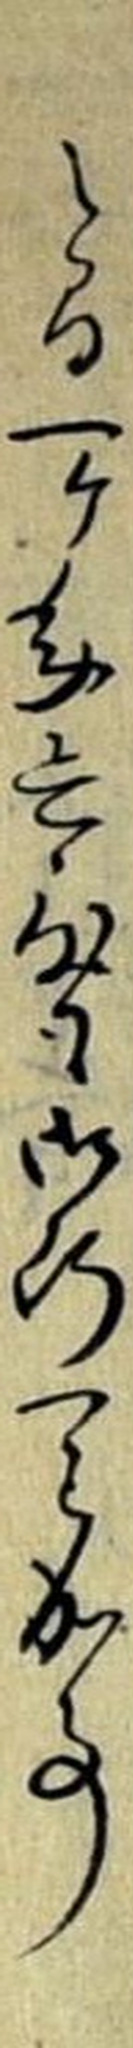之間一ヶ年壱度つヽ御供可被成事
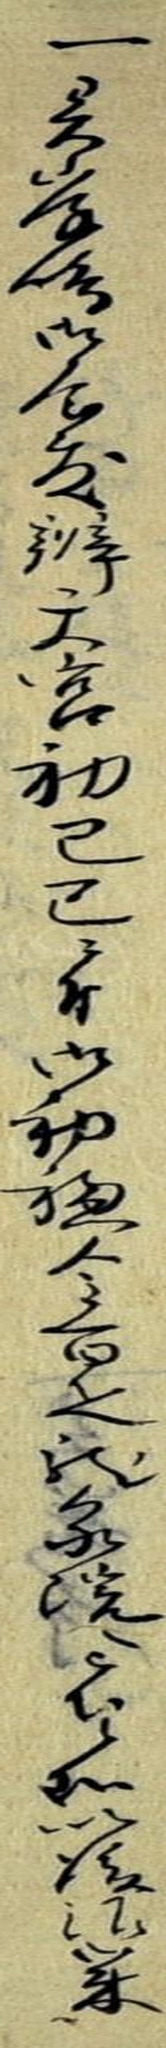一霊岸嶋御屋敷弁天宮初己巳に付御初穂金百疋龍泉院へ被下候処以後銀弐朱
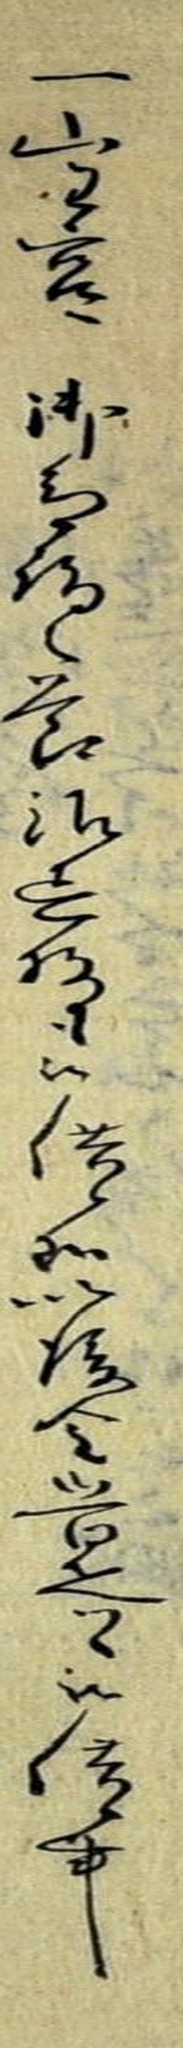一山王宮へ御参詣之節銀壱枚つヽ被供候処以後金弐百疋つヽ被供候事
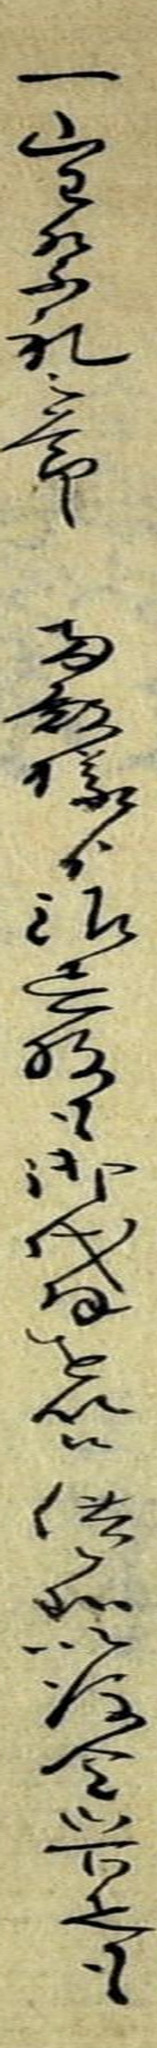一山王祭礼之節両殿様ゟ銀壱枚つヽ御代拝を以被供候処以後金弐百疋つヽ
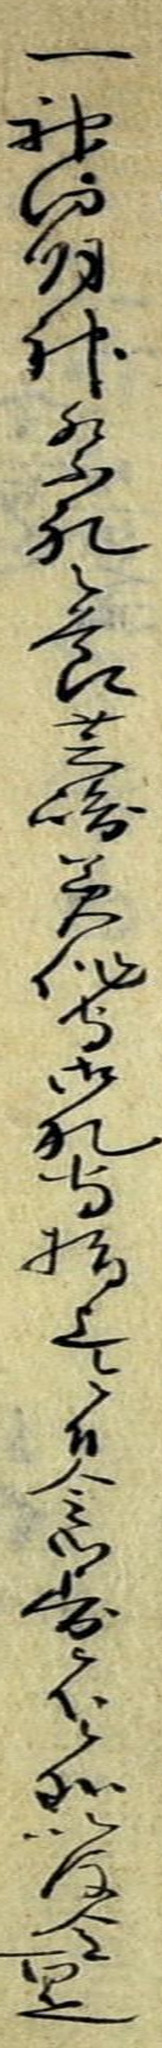一神田明神祭礼之節芝崎美作守御札守指上候に付金弐歩被下候処以後金百疋
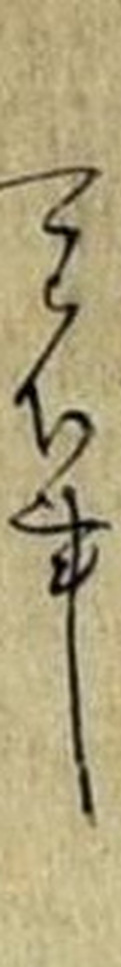可被下事
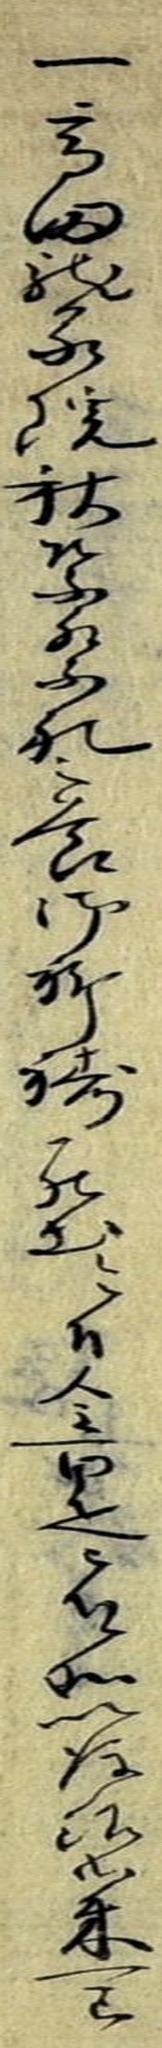一高田龍泉院秋祭祭礼之節御祈祷罷出候に付金百疋被下候処以後銀弐朱可被
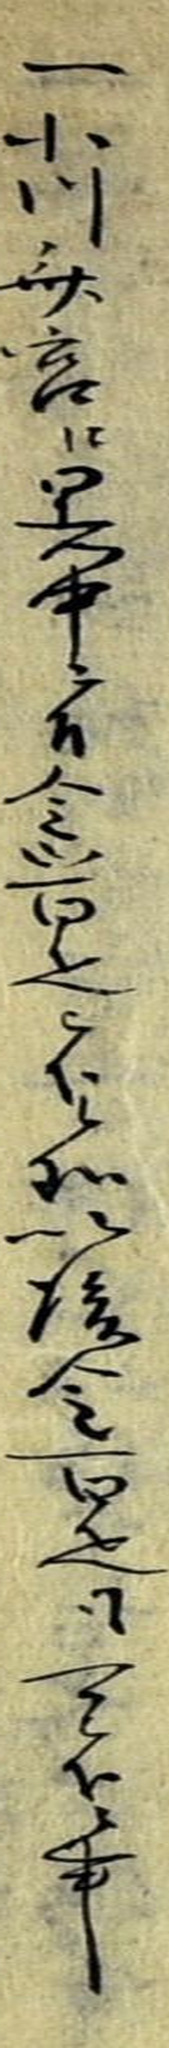一小川斉宮江暑中に付金弐百疋被下候処以後金百疋つヽ可被下候事
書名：命令之部 四
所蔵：福井県文書館 Fukui Prefectural Archives
